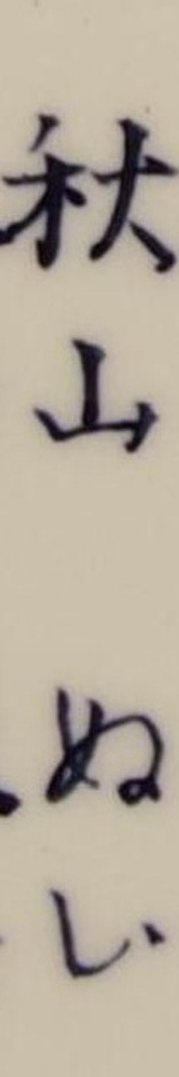秋山ぬい
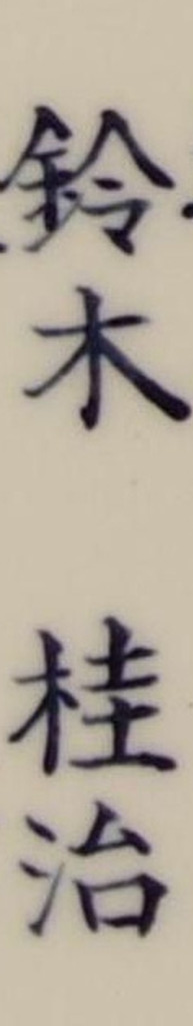鈴木桂治
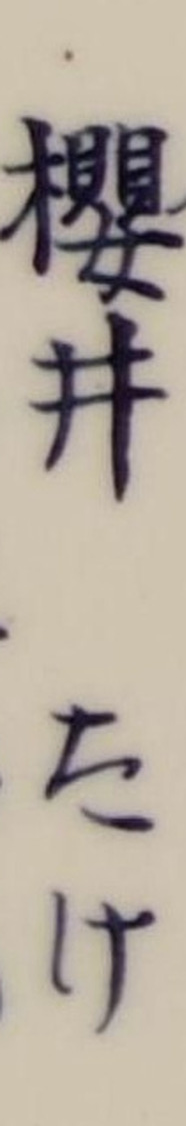桜井たけ
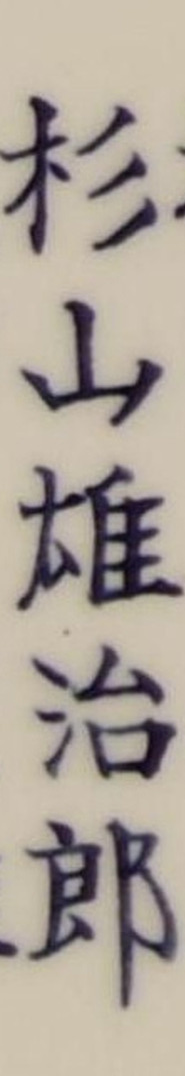杉山雄治郎
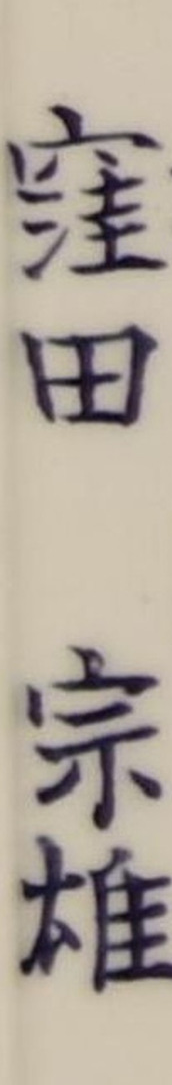窪田宗雄

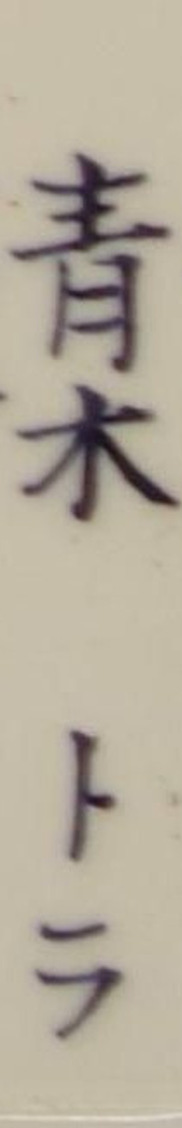青木トラ
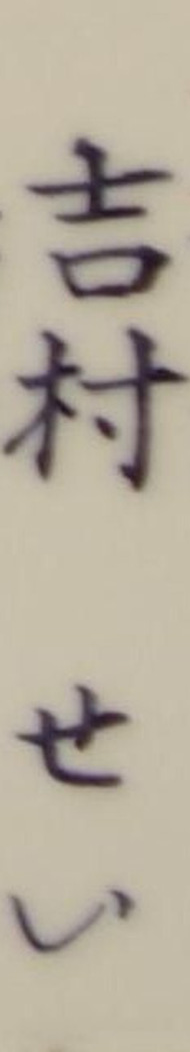吉村せい
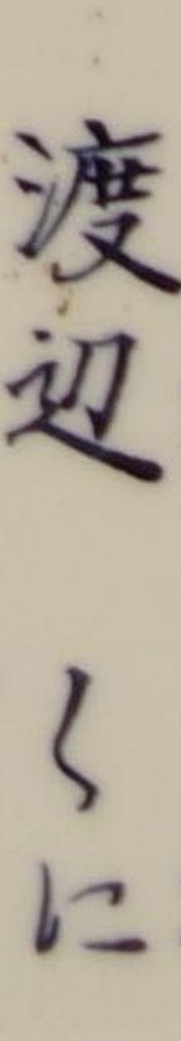渡辺くに
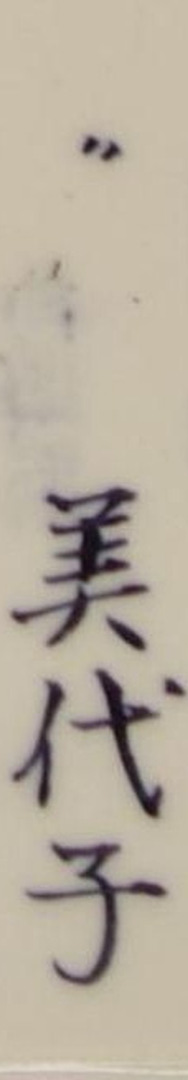美代子
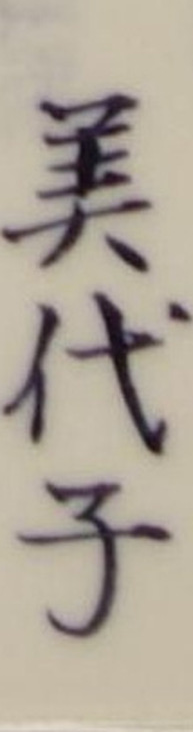美代子
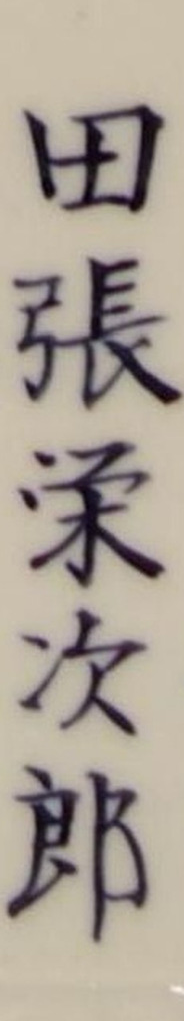田張栄次郎
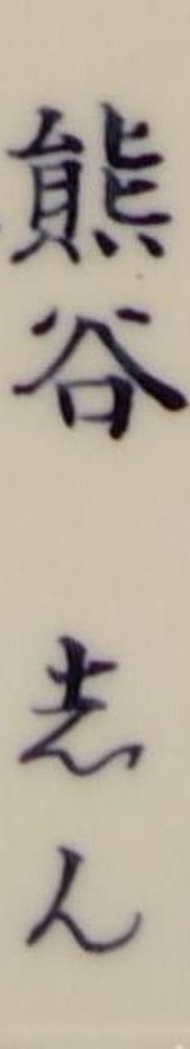熊谷しん
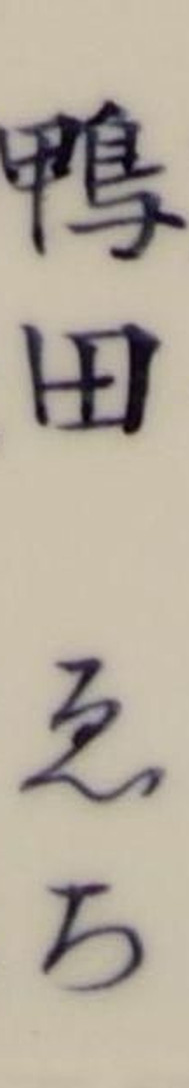鴨田ゑち
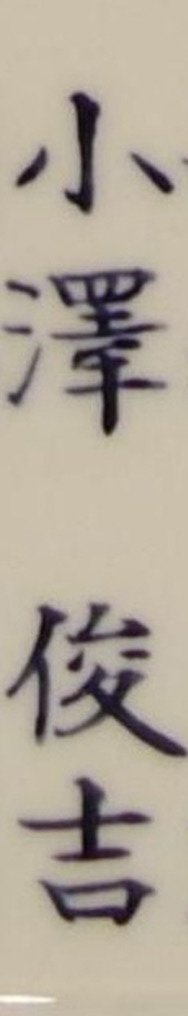小澤俊吉
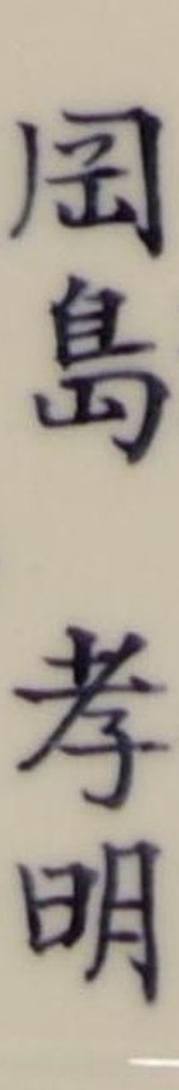岡島孝明
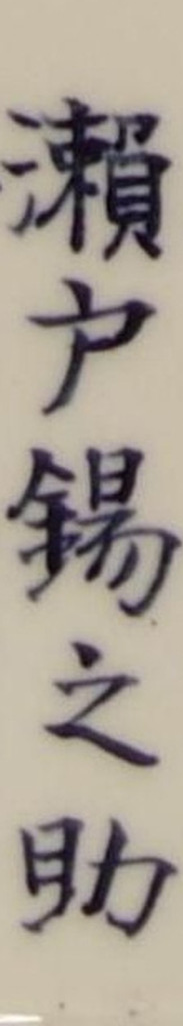瀬戸錫之助
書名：M~S
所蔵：高野山金剛峯寺
